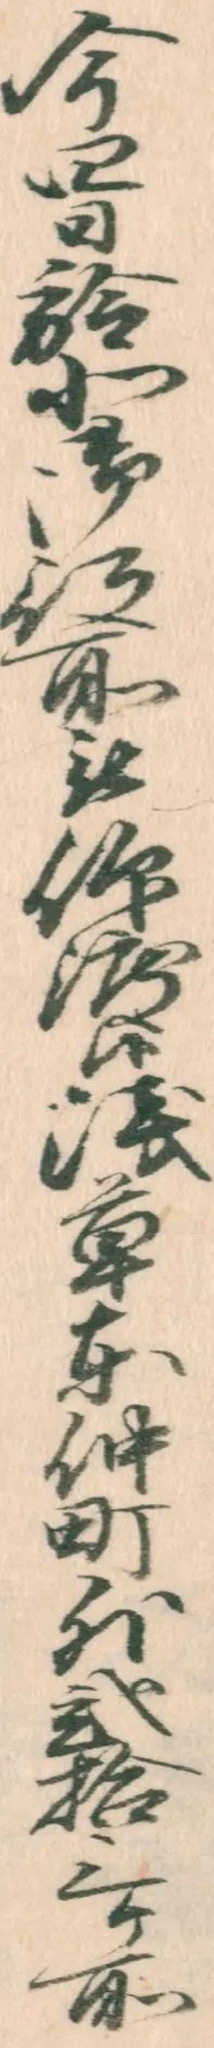今四日於北御役所被仰渡候浅草東仲町外弐拾三ケ所
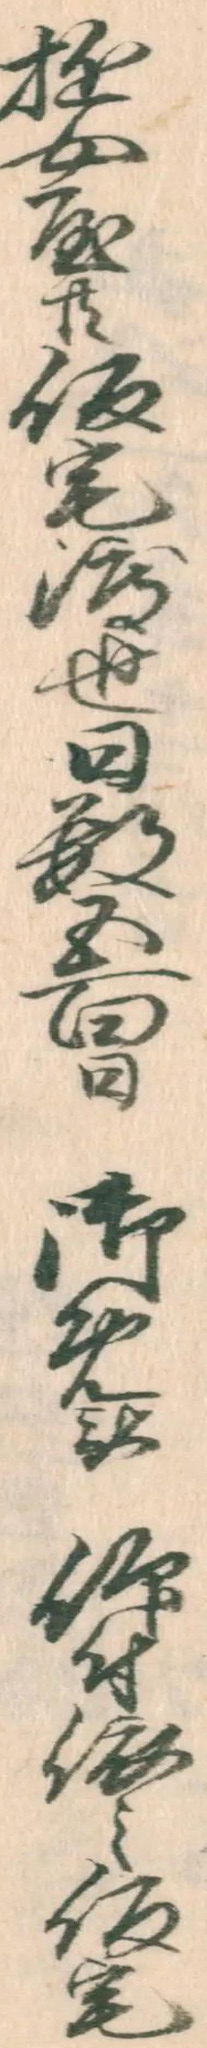遊女屋共仮宅渡世日数五百日御免被仰付依之仮宅
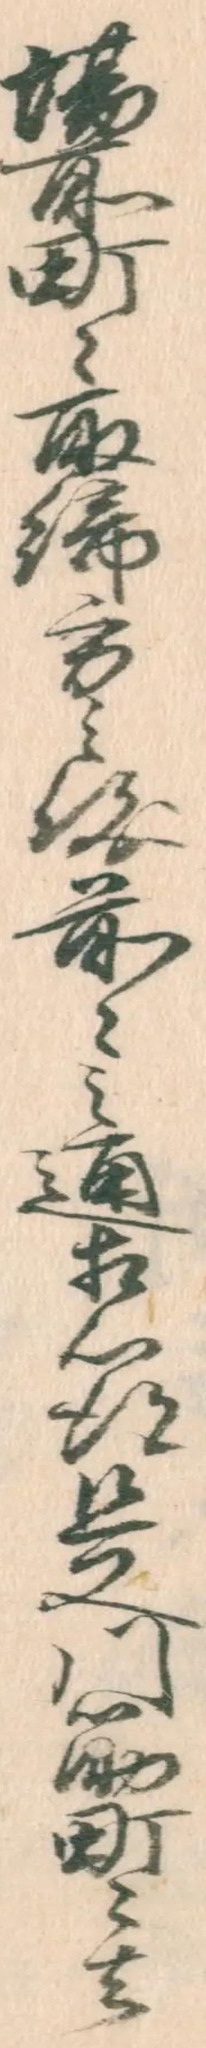場所町〻取締方之儀前〻之通相心得且又川筋町〻は
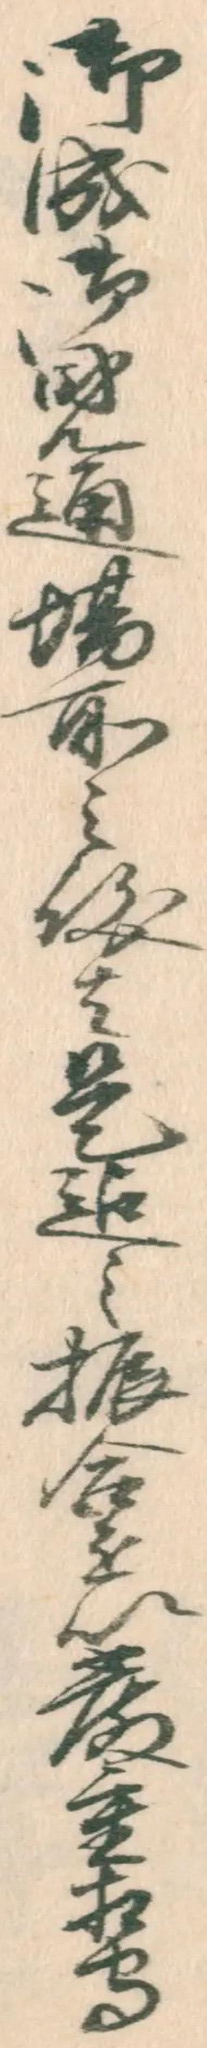御成御見通場所之儀は是迄之振合を以厳重相守
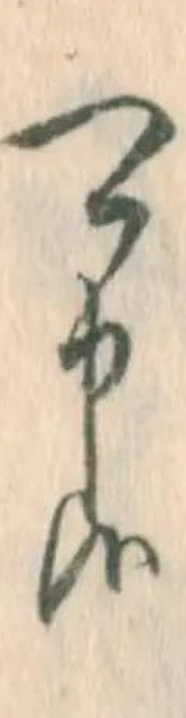可申候

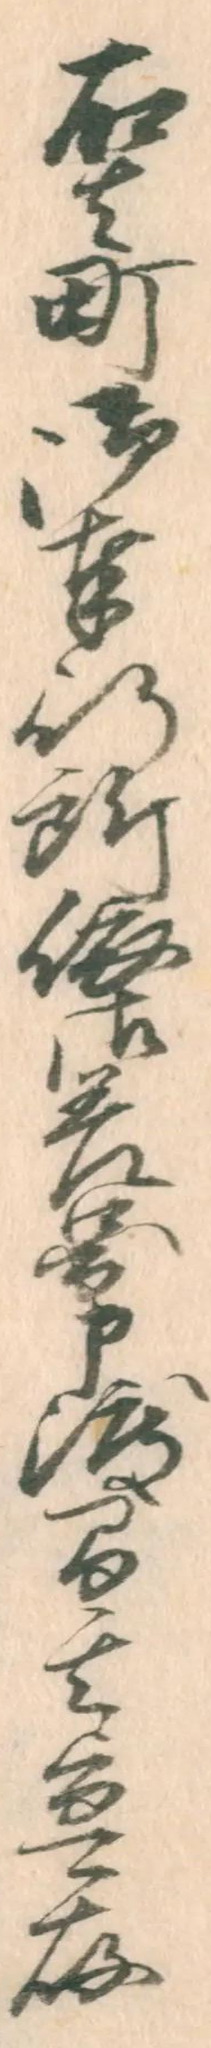右は町御奉行所依御指図申渡間其旨可存
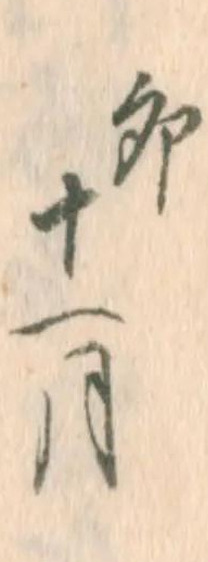卯十一月
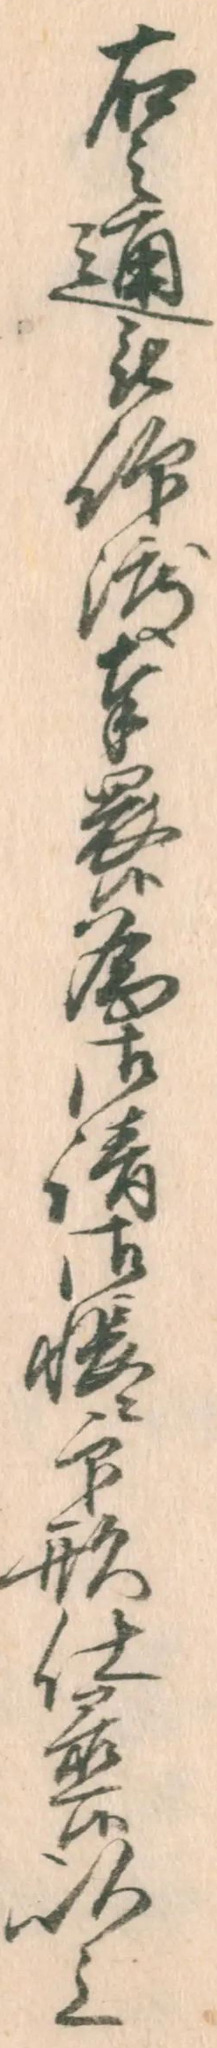右之通被仰渡奉畏候為御請御帳ニ印形仕置候以上
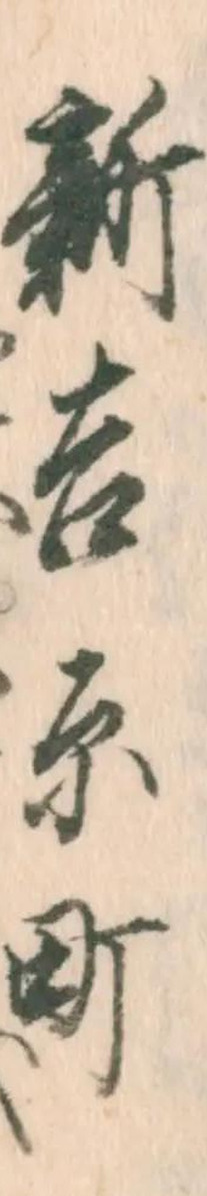新吉原町
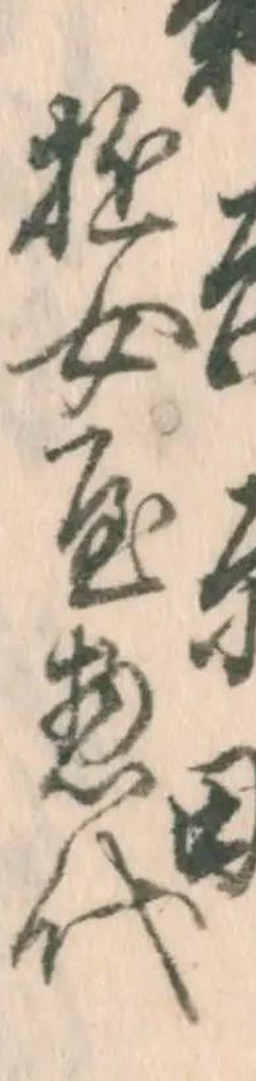遊女屋惣代
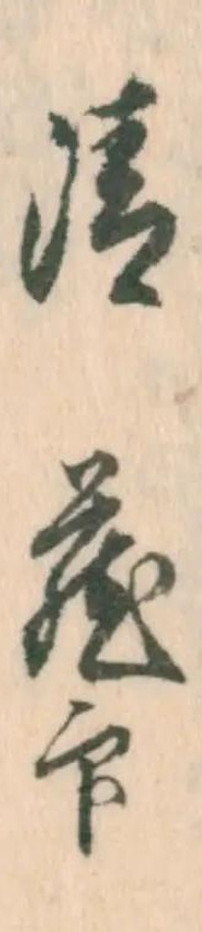清蔵印
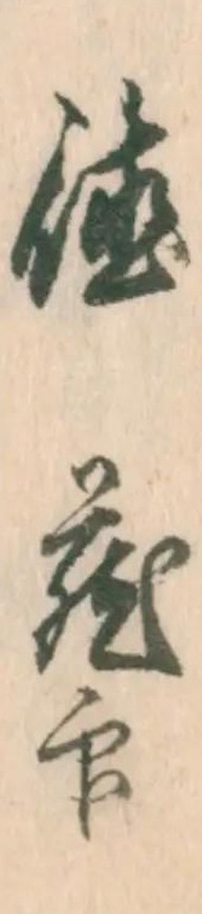徳蔵印
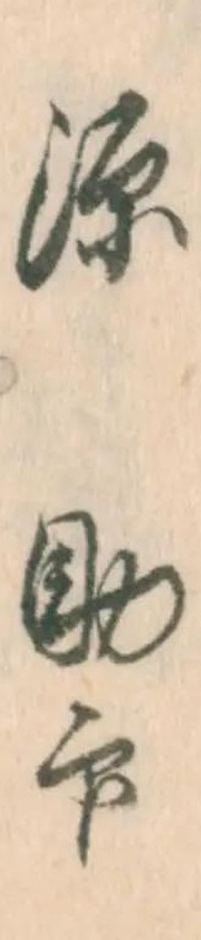源助印
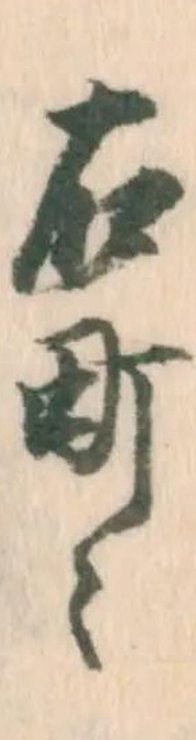右町〻
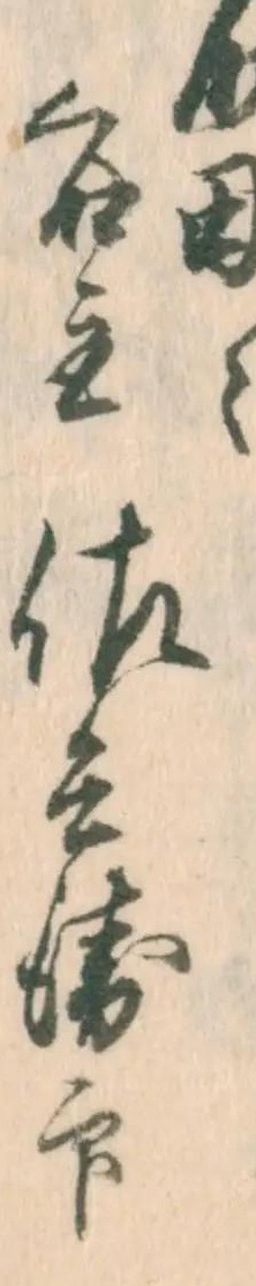名主佐兵衛印
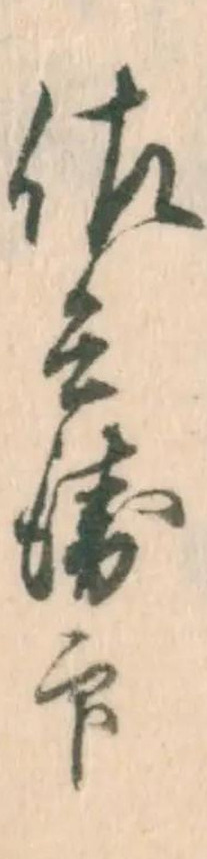名主佐兵衛印
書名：地震災書留 2巻. [2] 内表紙に「地震一件　安政二卯年十月」とあり
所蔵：国立国会図書館 National Diet Library, JAPAN
